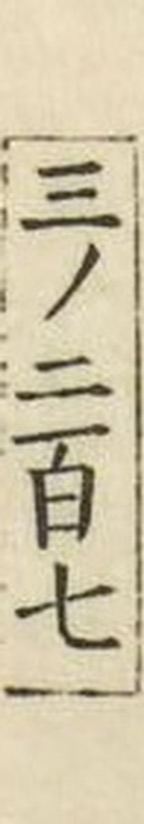三ノ二百七

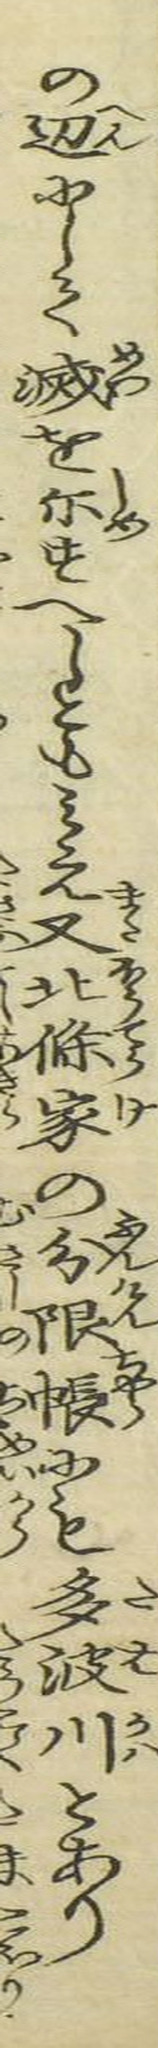の辺にして滅を尓すへしともみえ又北条家の分限帳にも多波川とあり
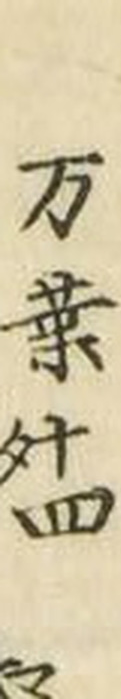万葉十四
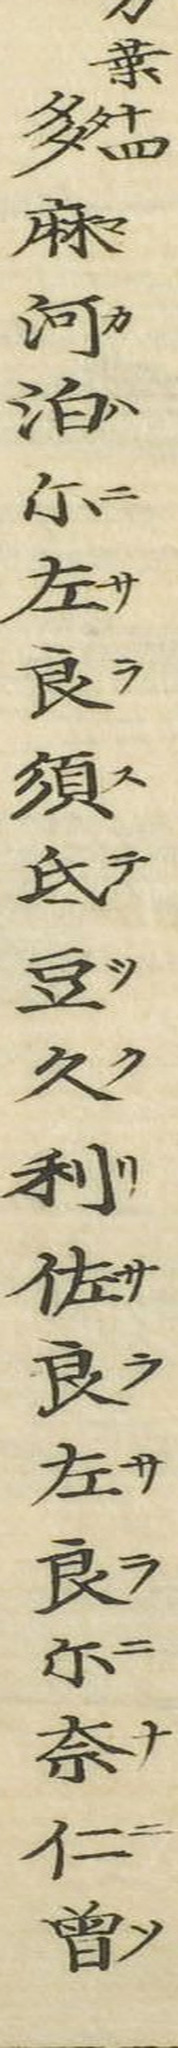多麻河泊尓左良須氐豆久利佐良左良尓奈仁曽
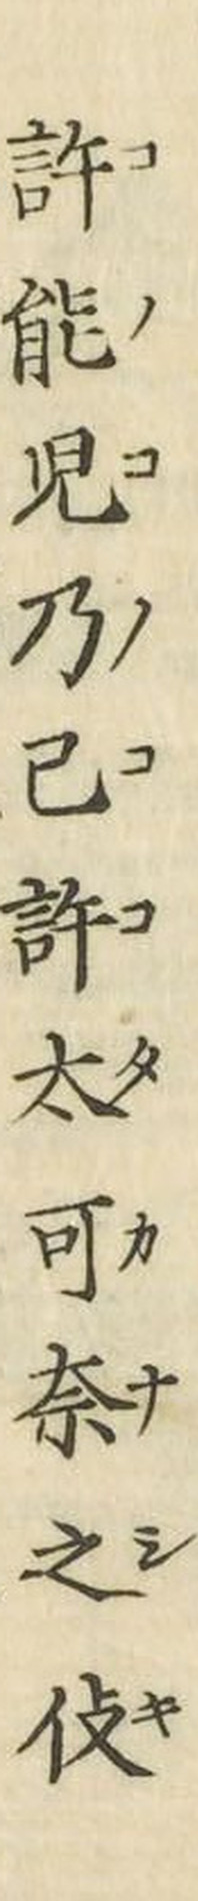許能児乃己許太可奈之伎
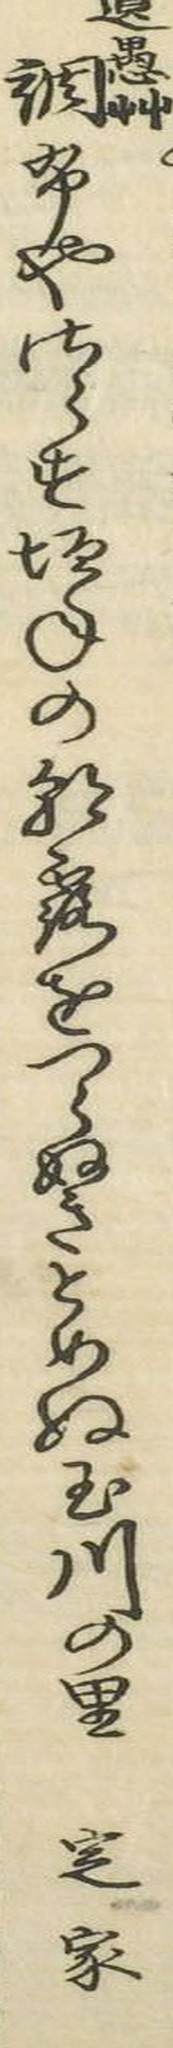調布やさらす垣ねの朝露をつらぬきとめぬ玉川の里定家
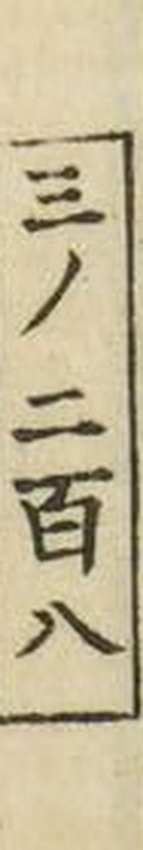三ノ二百八
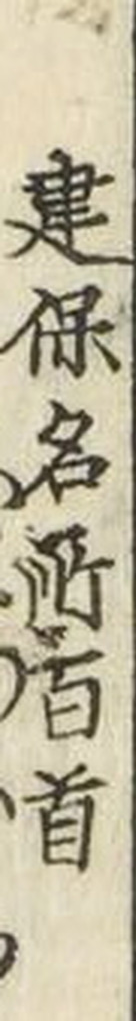建保名所百首
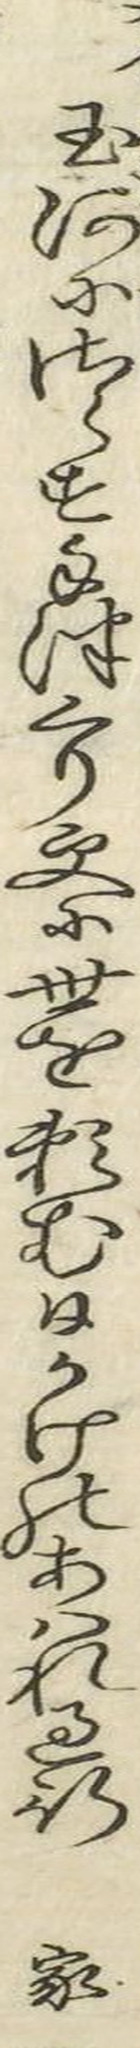玉河にさらすてつくり更に世を頼む日かけのあはれ過行家隆
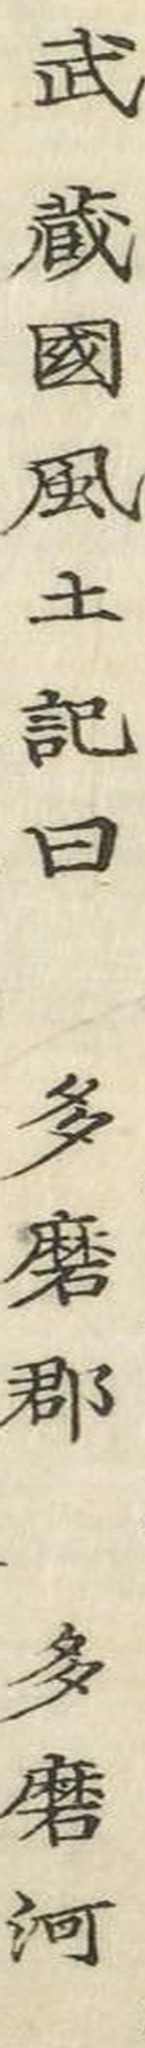武蔵国風土記曰多磨郡多磨河
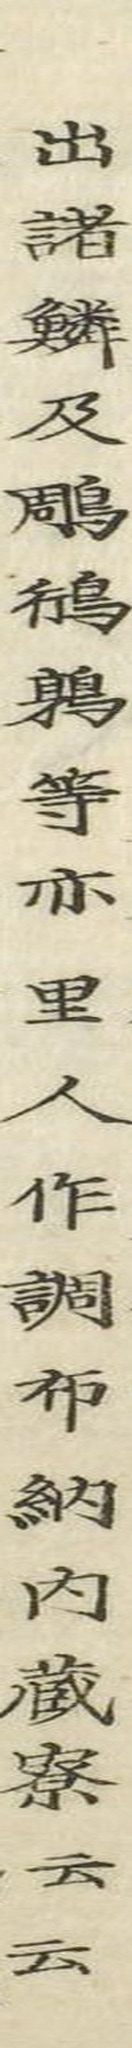出諸鱗及鵰鴴鵢等亦里人作調布納内蔵寮云々
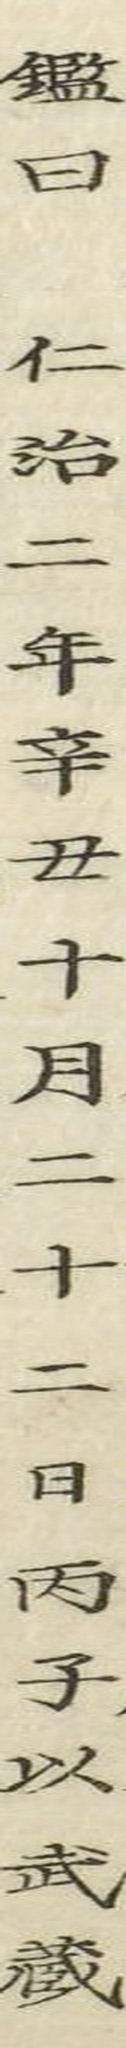東鑑曰仁治二年辛丑十月二十二日丙子以武蔵
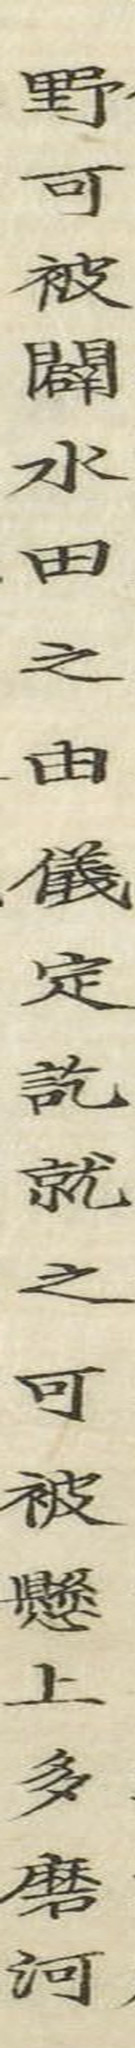野可被闢水田之由儀定訖就之可被懸上多磨河
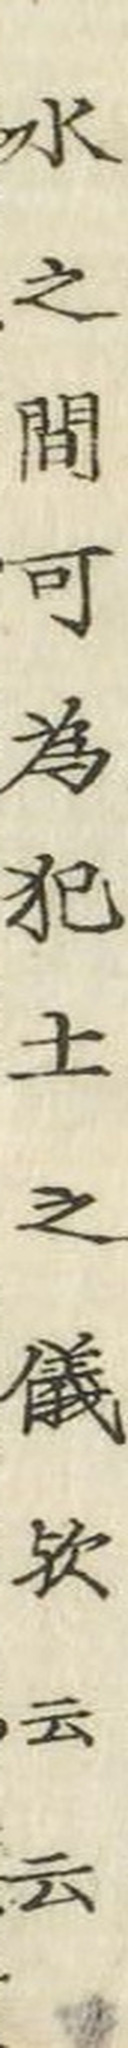水之間可為犯土之儀歟云々
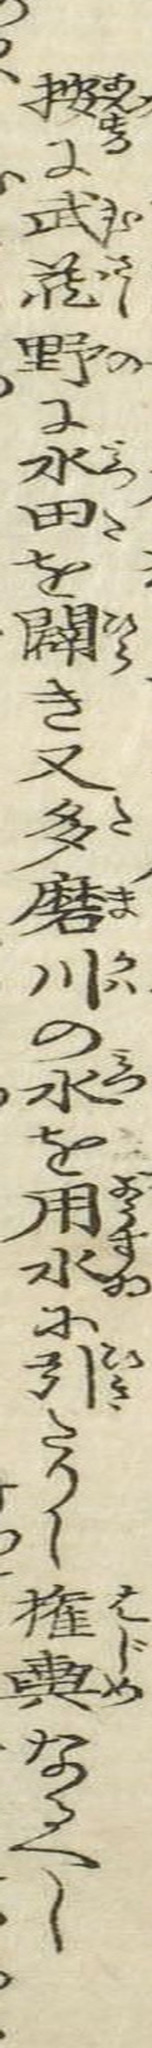按に武蔵野に水田を闢き又多磨川の水を用水に引たりし権輿なるへし
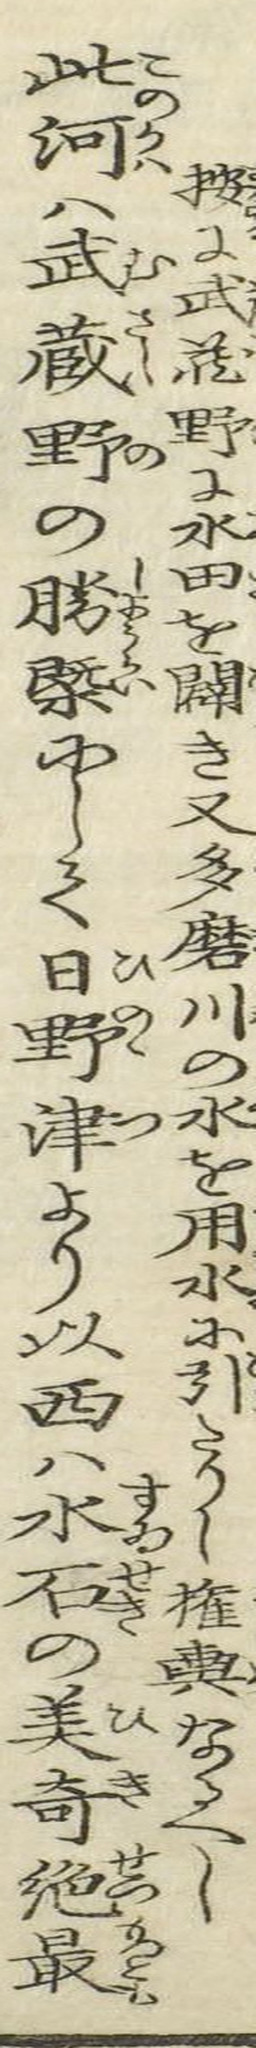此河は武蔵野の勝概にして日野津より以西は水石の美奇絶最
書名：江戸名所図会 20巻 巻之10
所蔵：東京学芸大学教育コンテンツアーカイブ
